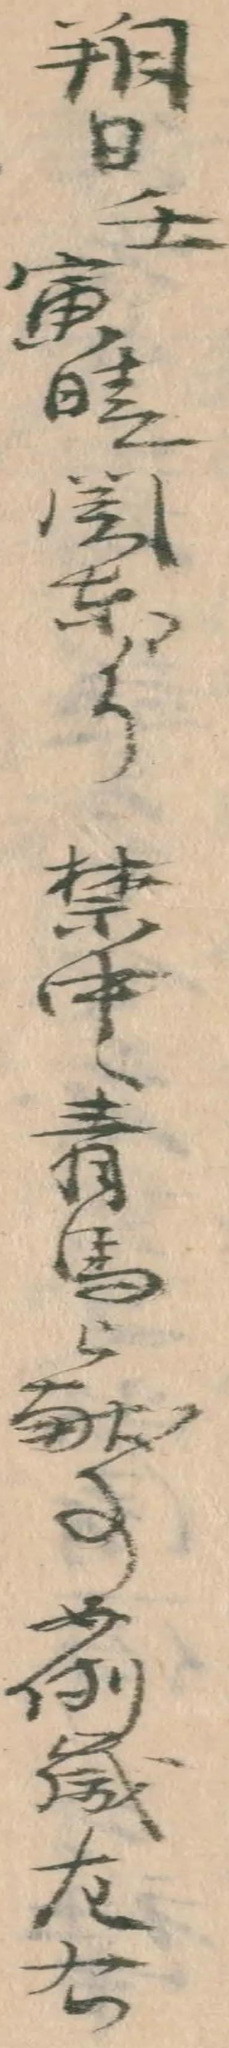朔日壬寅晴関東より禁中へ青馬被献事如例歳左右
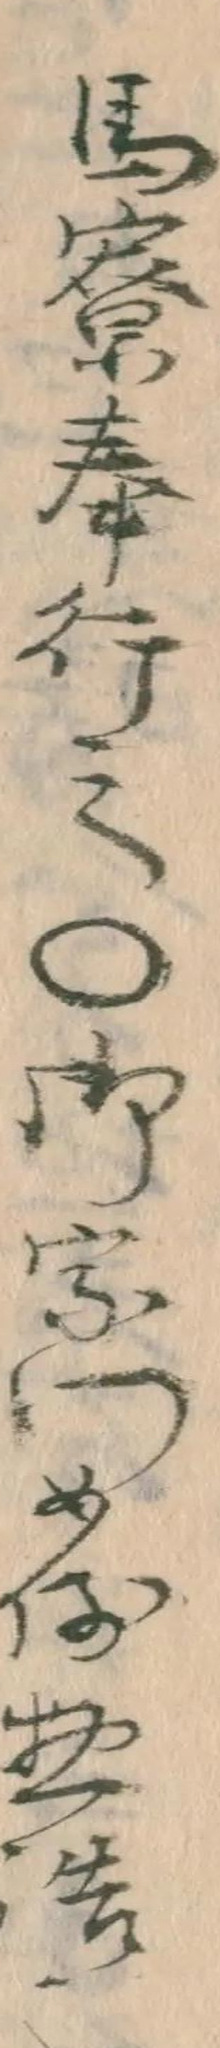馬寮奉行之〇御家門如例惣詰也
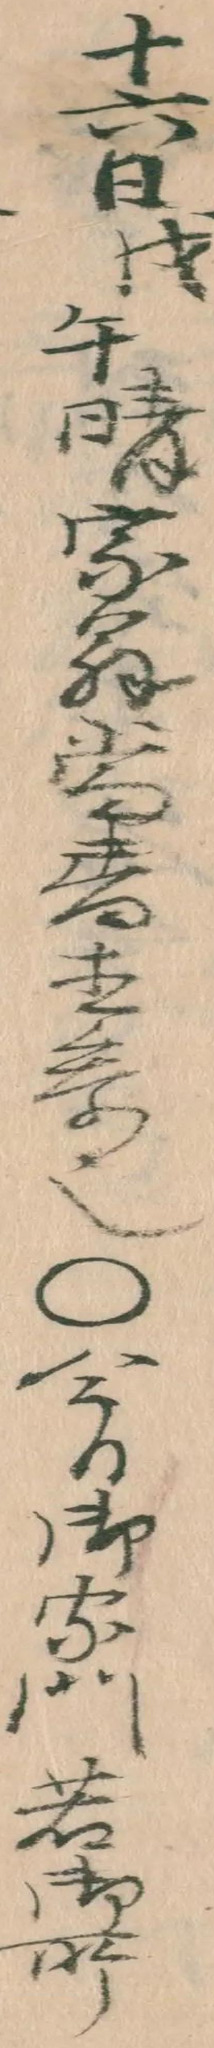十六日戊午晴家翁当番直参也〇今日御家門若御所
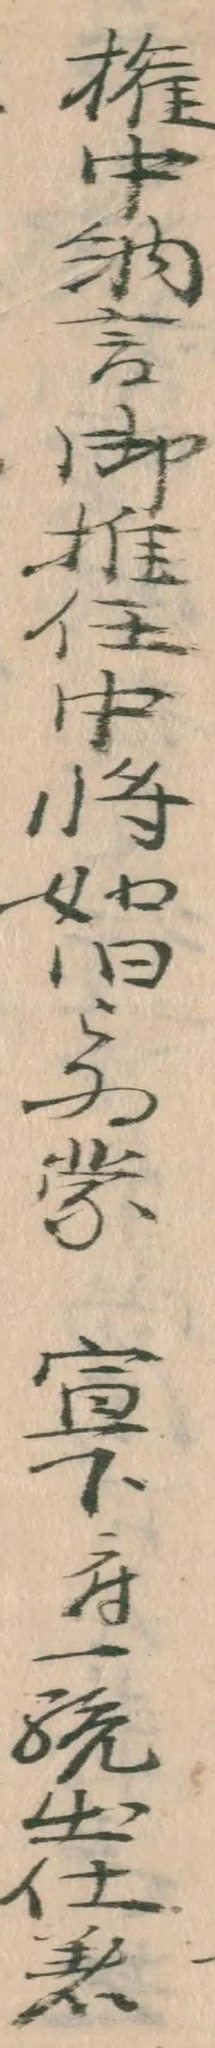権中納言御推任中将如旧被為蒙宣下ニ付一統出仕着
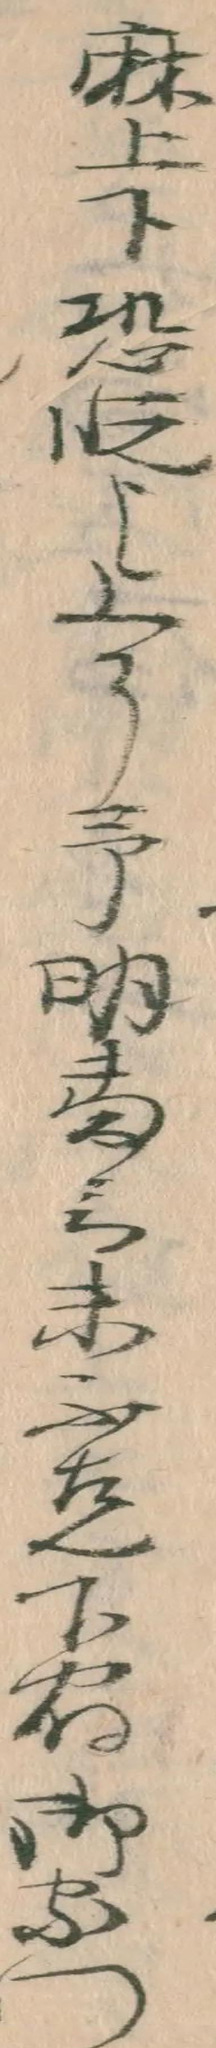麻上下恐悦申上候予明番ニ而未不克下宿御家門
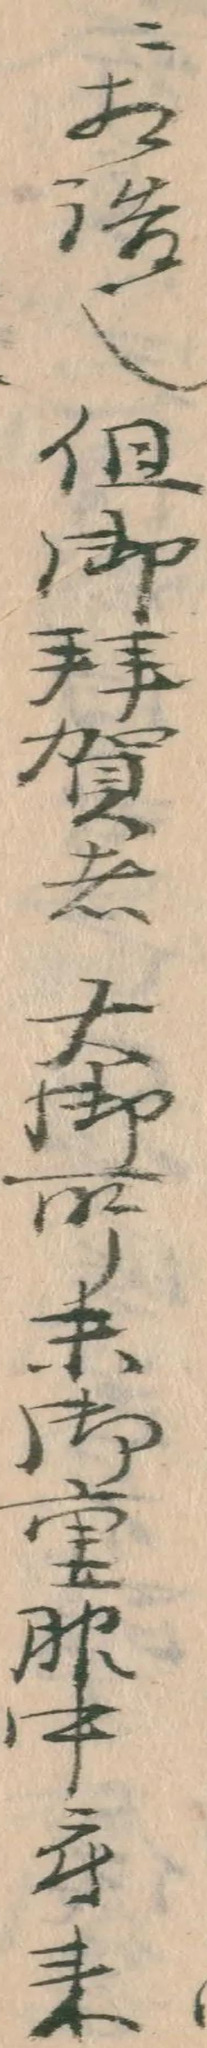ニ相詰也但御拝賀者大御所末御重服中ニ付来
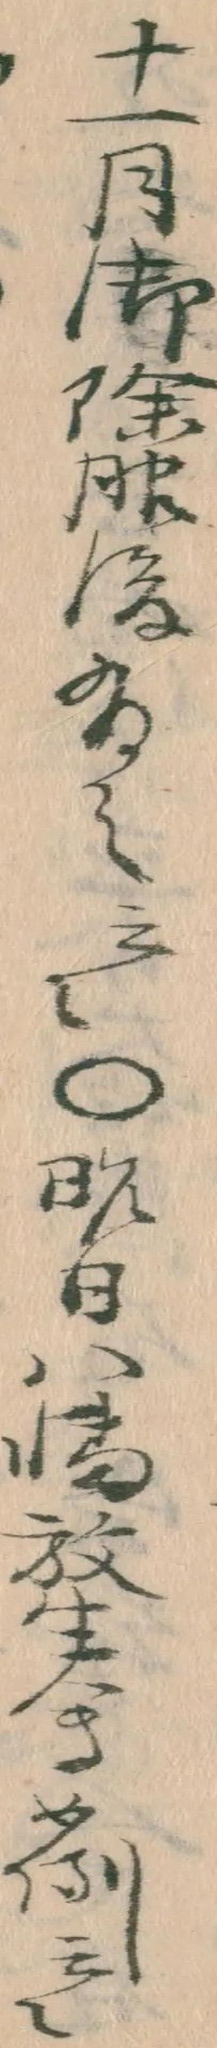十一月御除服後有之云々○昨日八幡放生会如例云〻
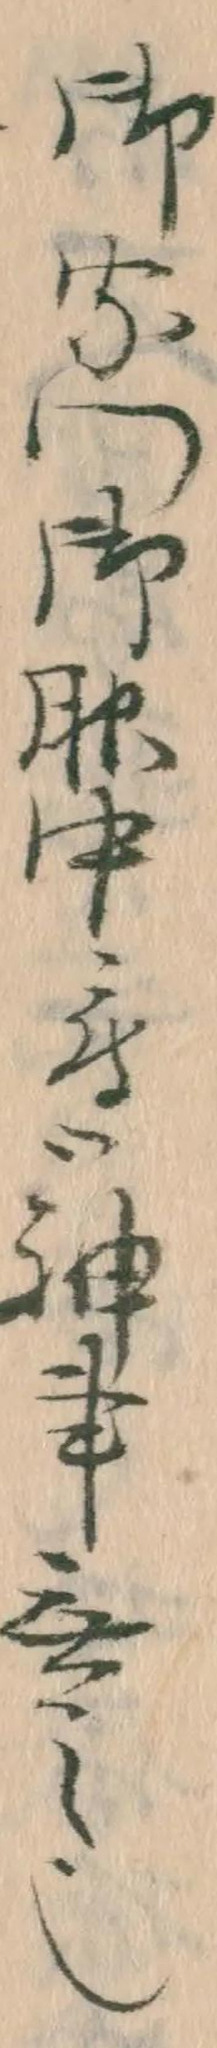御家門御服中ニ付御神事無之也
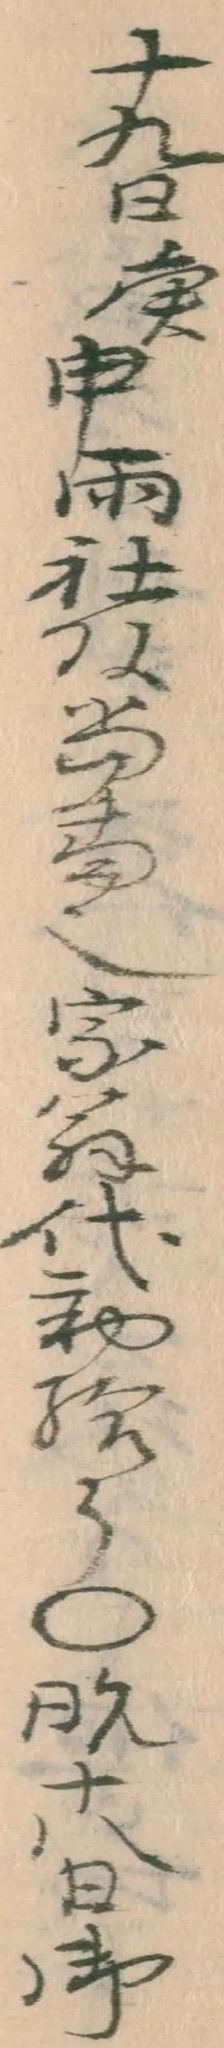十九日庚申雨社頭當番也家翁代勤給了○晩十八日御
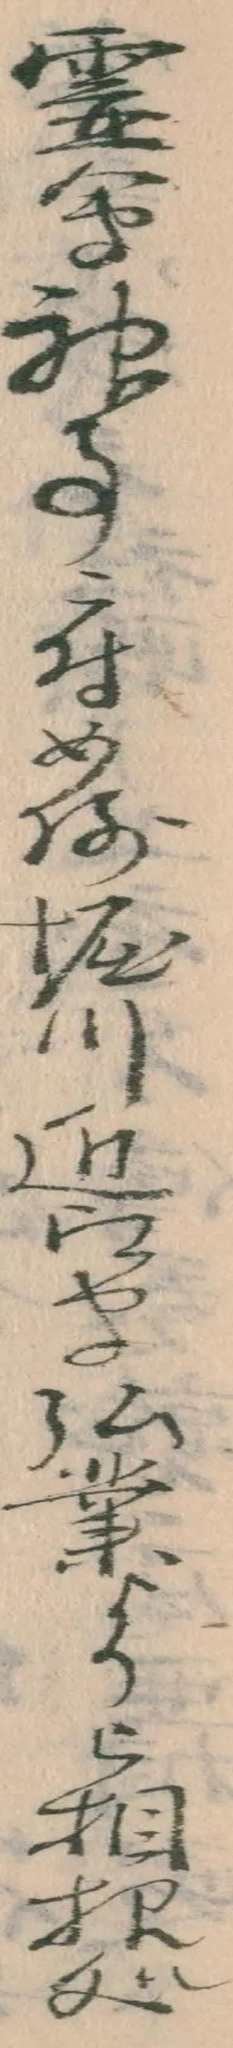霊舎神事ニ付如例堀川近江守弘業より被相招処
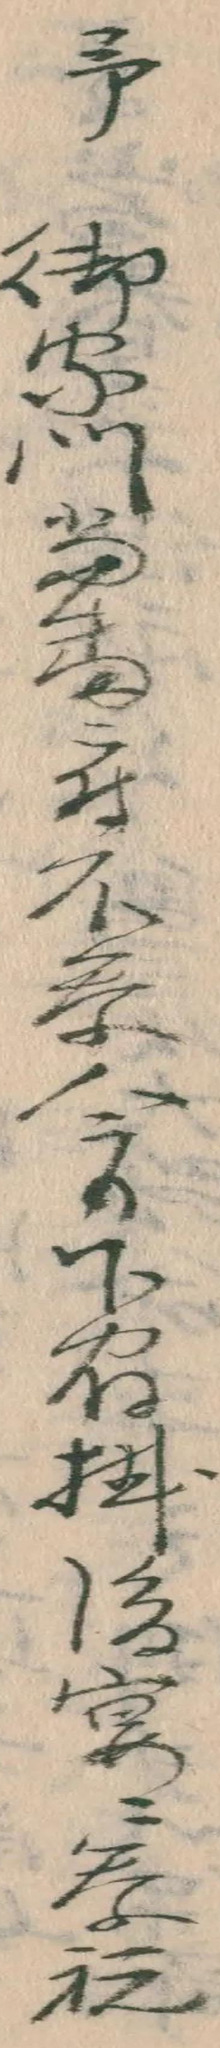予御家門當番ニ付不参今日下宿掛後宴ニ祭祝
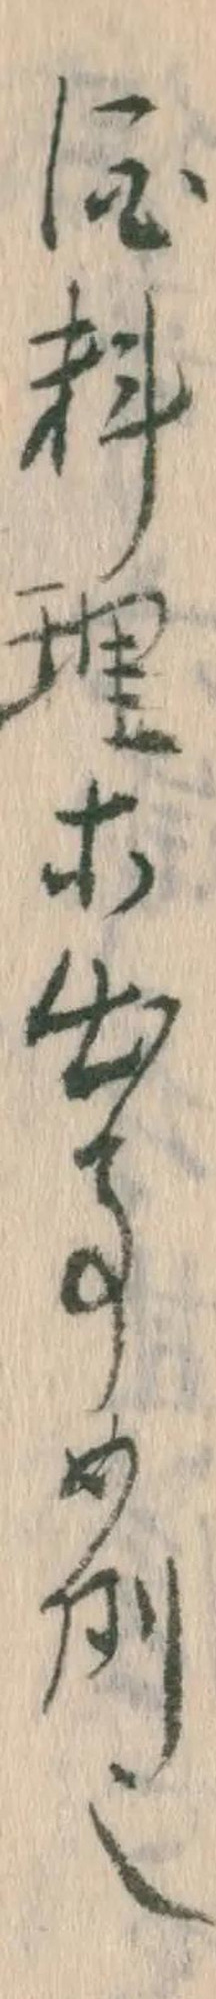注科理等出事如例也
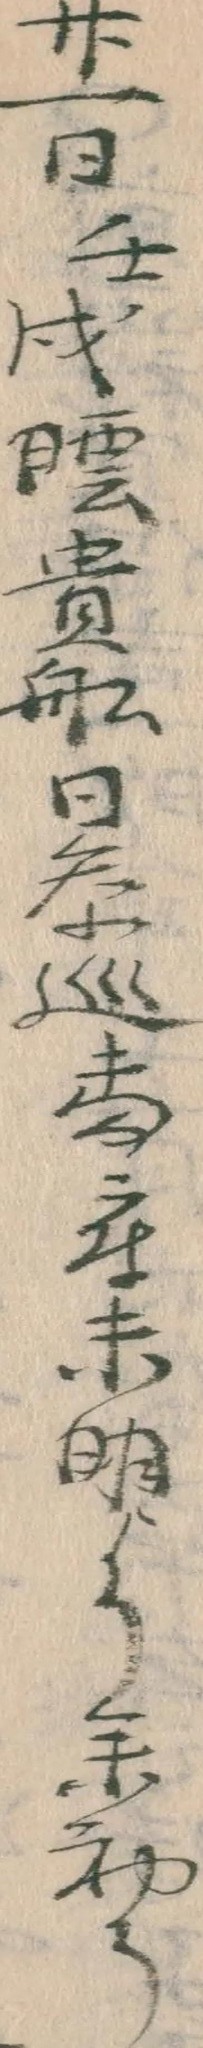廿一日壬戌曇貴船日参巡番ニ付未明より参勤了
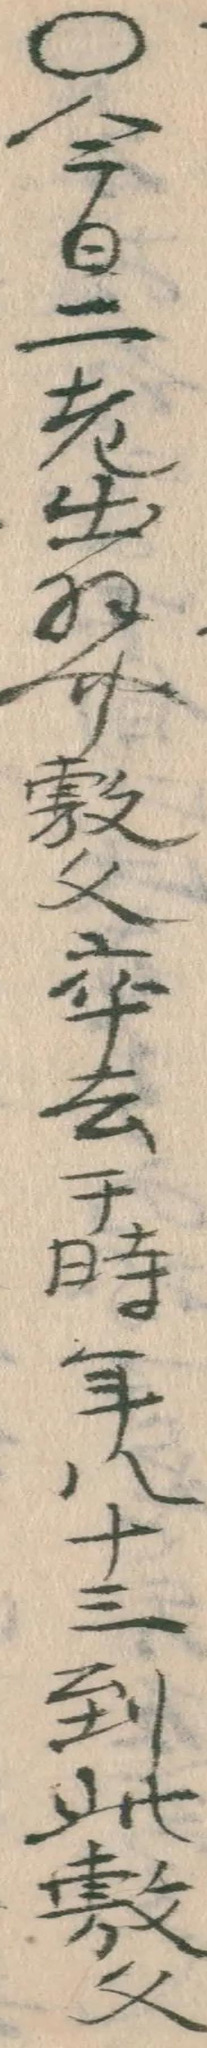○今日二老出羽介敷久卒去于時年八十三到此敷久
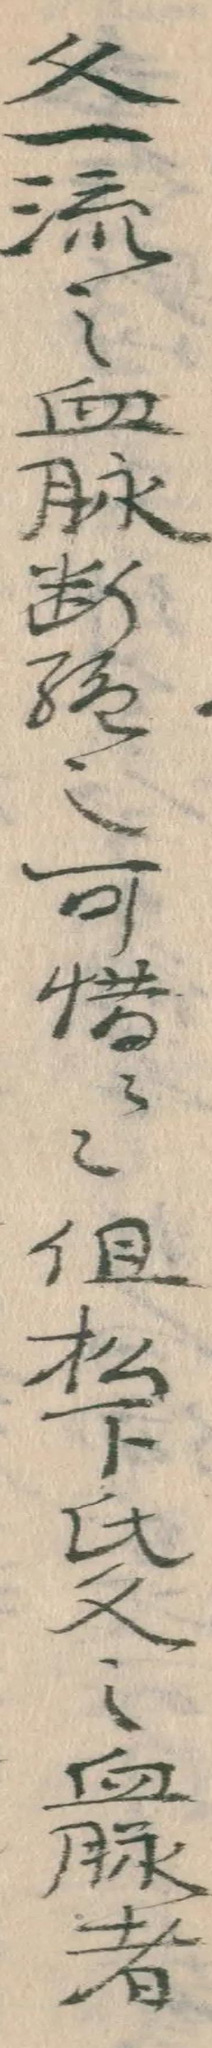久一流之血脉断絶也可惜〻〻但松下氏久之血脈者
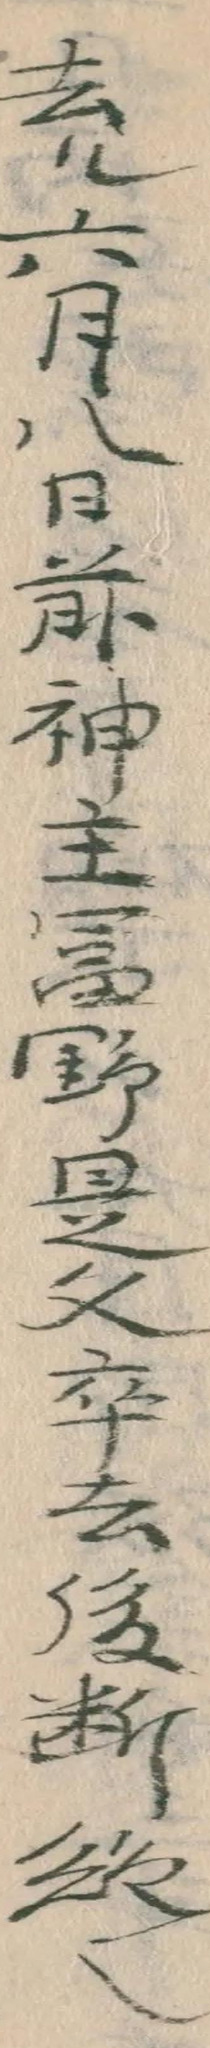去ル六月八日前神主冨野是久卒去後断絶也
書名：賀茂社記録. 第63冊
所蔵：国立国会図書館 National Diet Library, JAPAN
